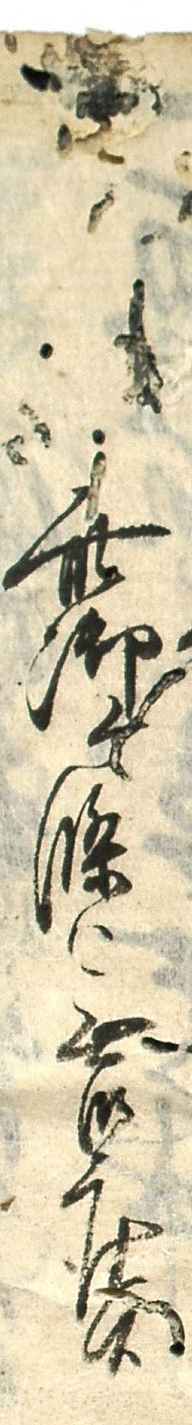此御ヶ條ハ無御座候
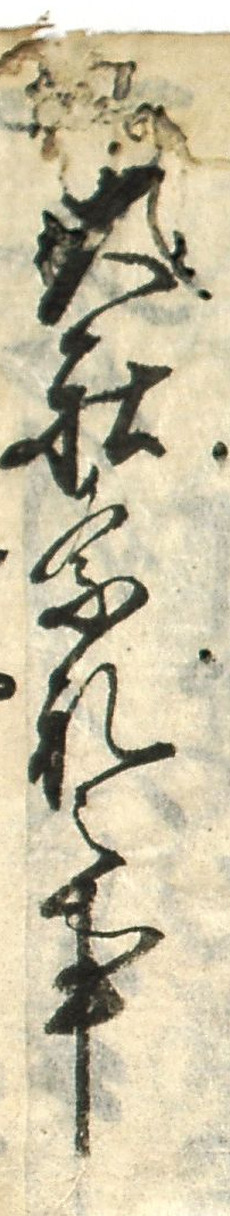一大社祭礼之事
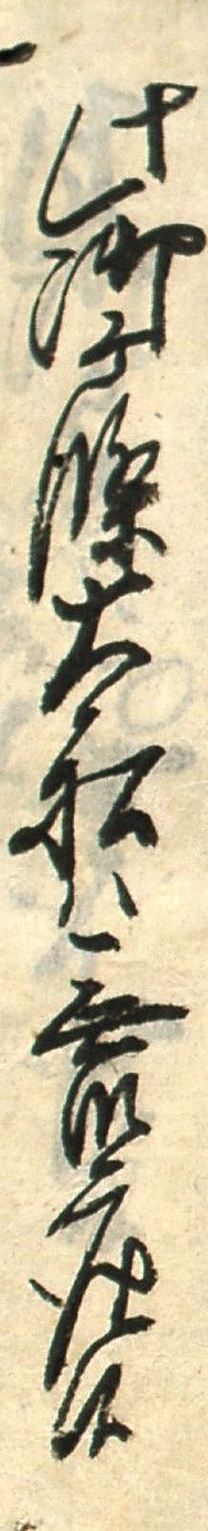此御ヶ條大社ハ無御座候
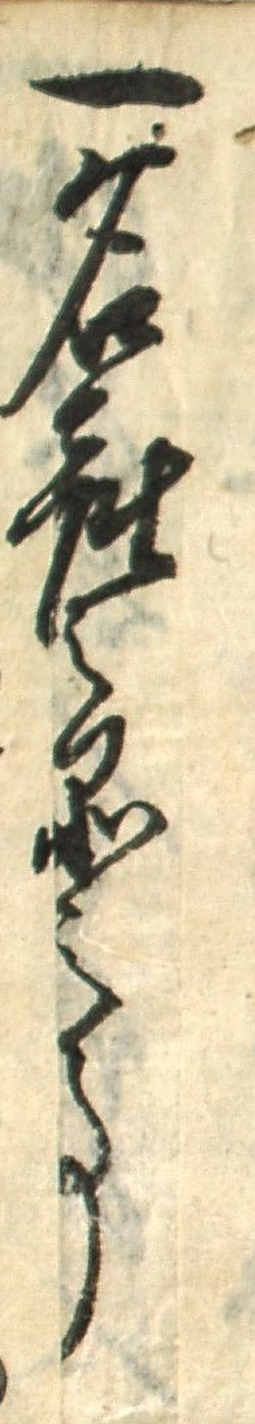一名産之品之事
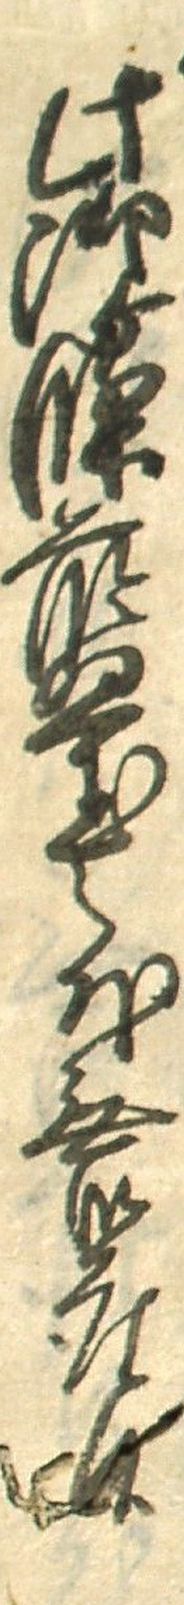此御ヶ條藍玉之外無御座候

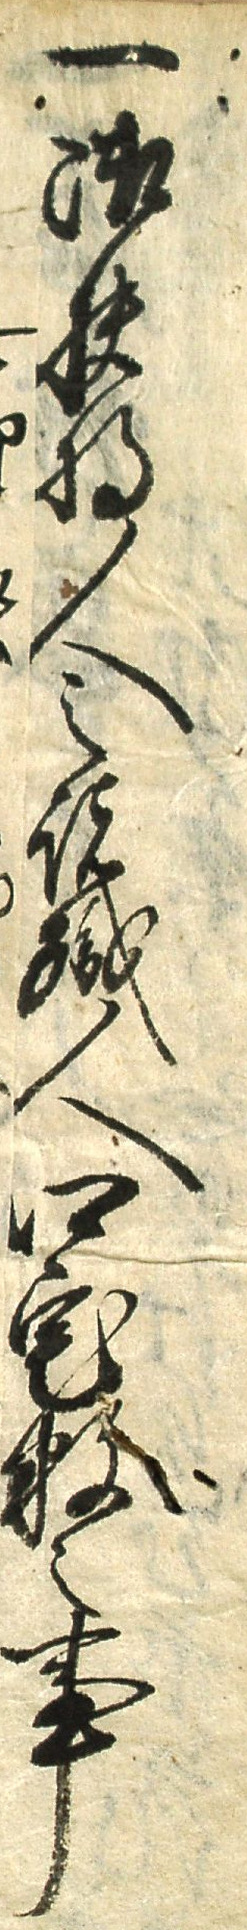一御扶持人之諸職人郷宅数之事
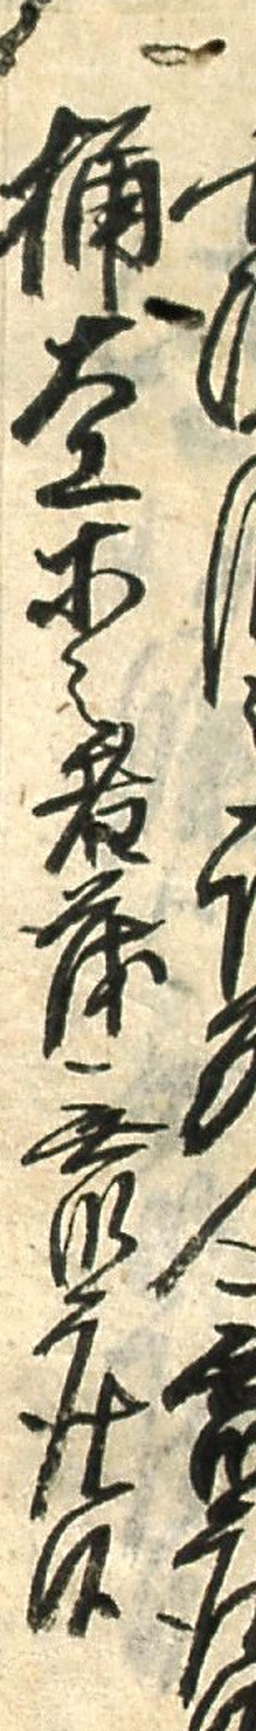桶大工等之者茂無御座候
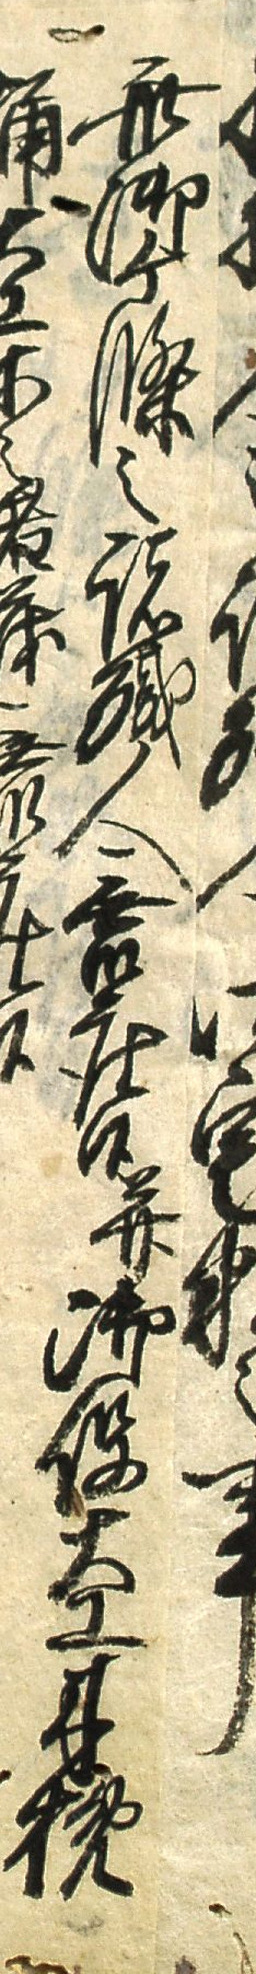此御ヶ條之諸職人無御座候幷御役大工木挽
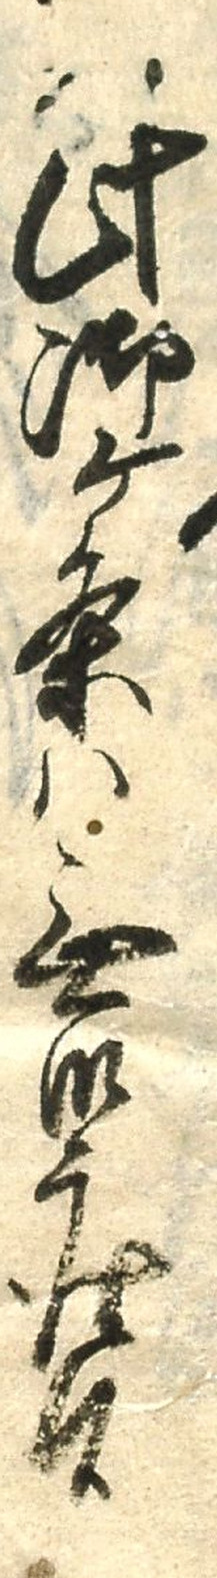此御ヶ条ハ無御座候
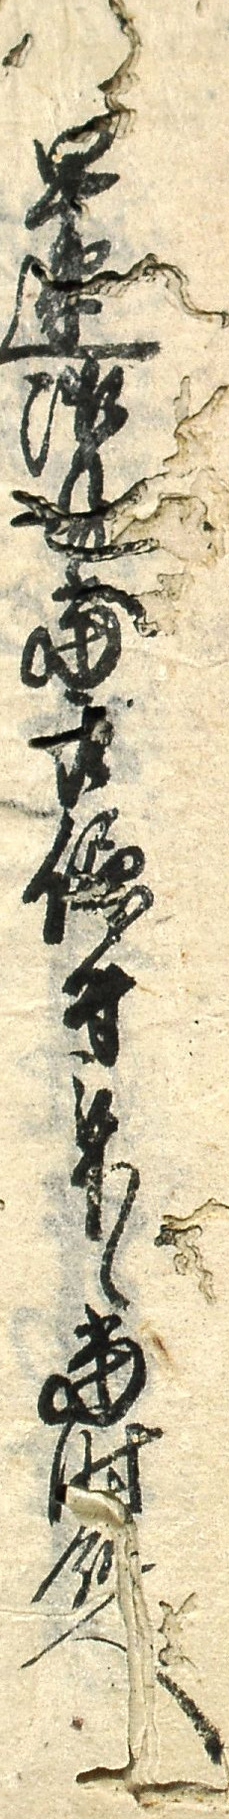早速御當被仰付被下候當時飢人
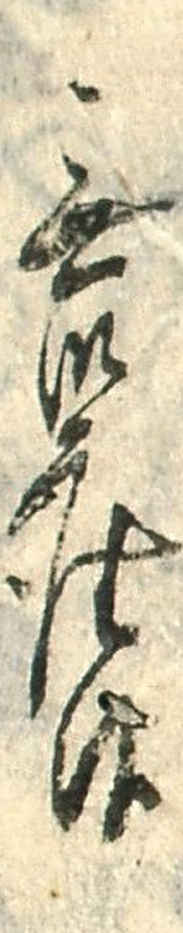無御座候
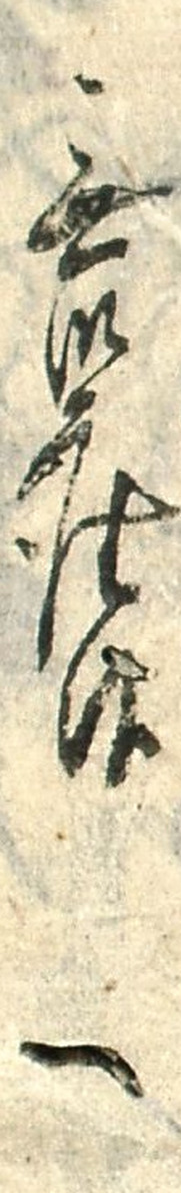無御座候
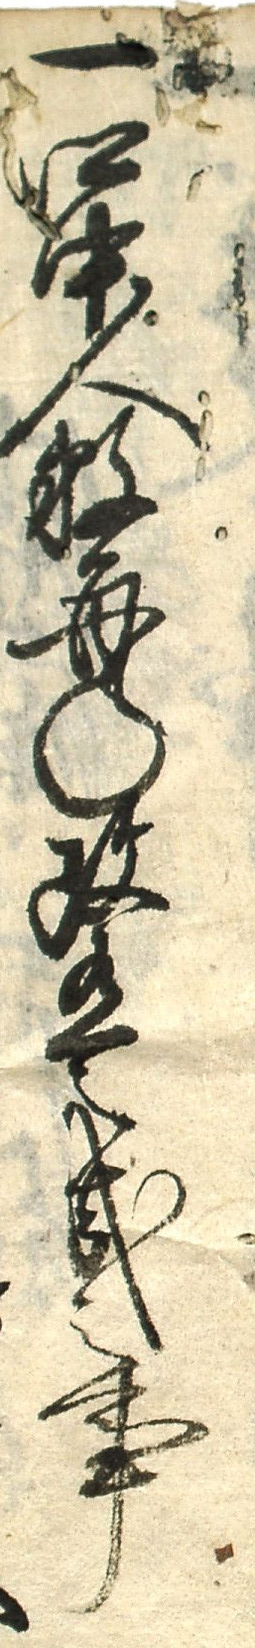一郷中人数毎年改有之哉之事
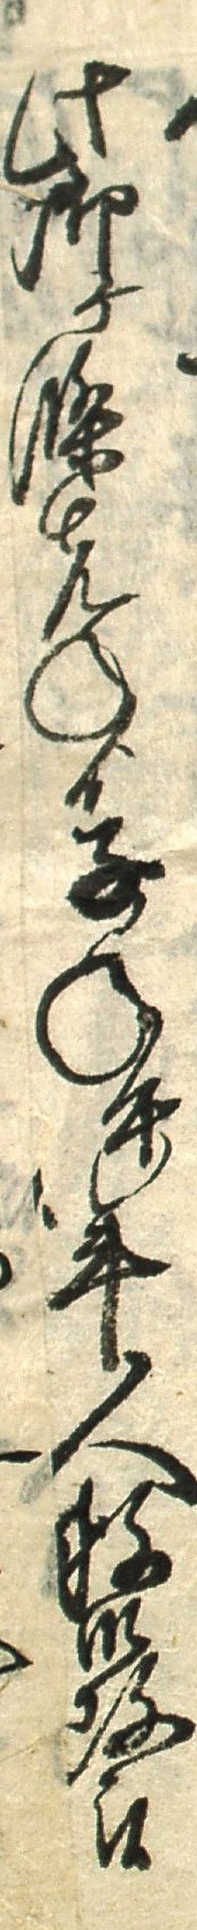此御ヶ條先年ゟ子ノ年午ノ年人数御改被
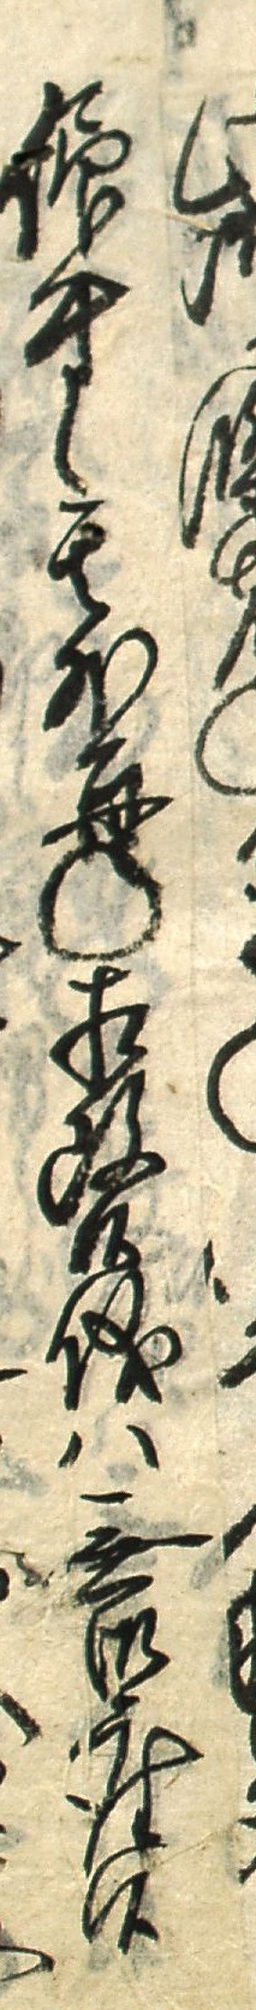仰付候其外毎年相改候儀ハ無御座候
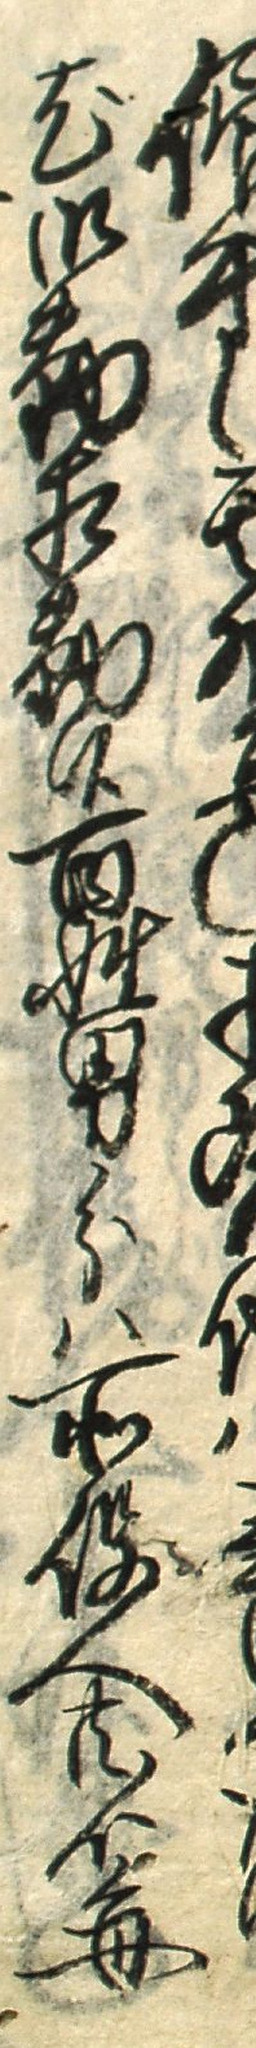尤御勤相勤候百姓男分ハ所役人共ゟ毎
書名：御ヶ条ヲ以被仰附株々申上帳（早渕村控）
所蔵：鳴門教育大学 Naruto University of Education
